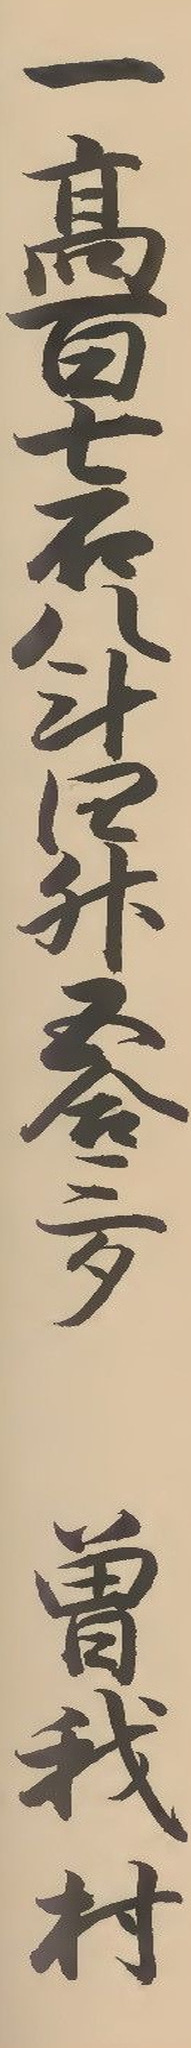一髙百七石八斗四升五合三夕曽我村
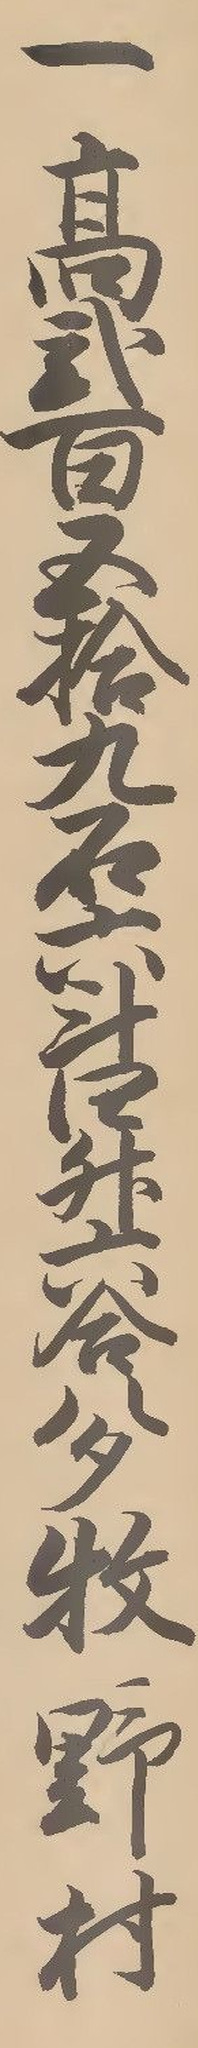一髙弐百五拾九石六斗四升六合八夕牧野村
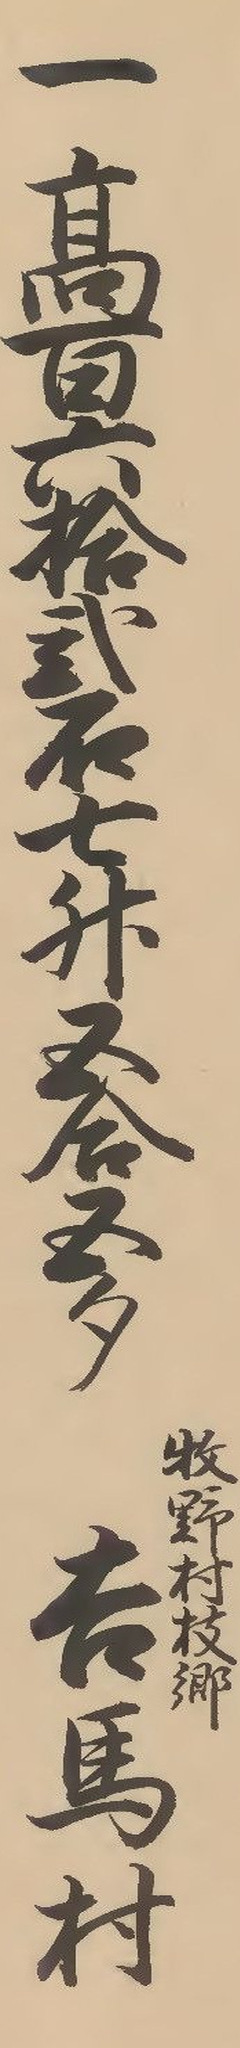一髙百六拾弐石七升五合五夕吉馬村
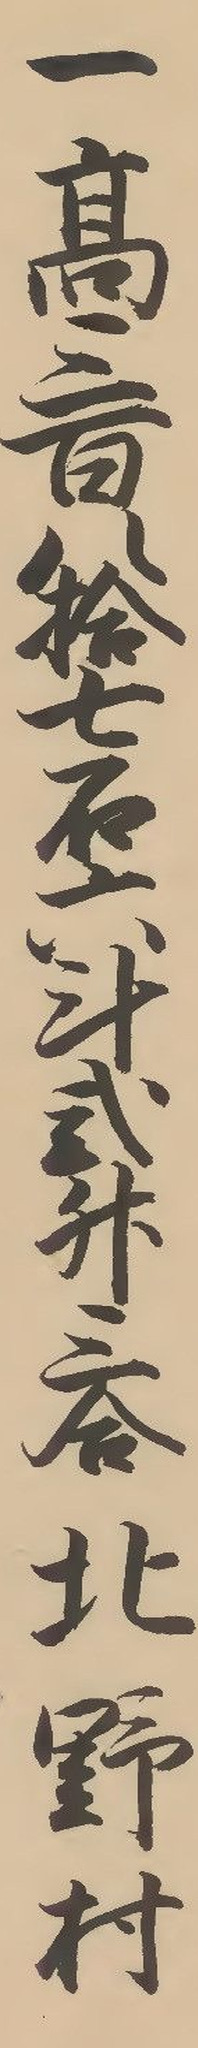一髙三百八拾七石六斗弐升三合北野村
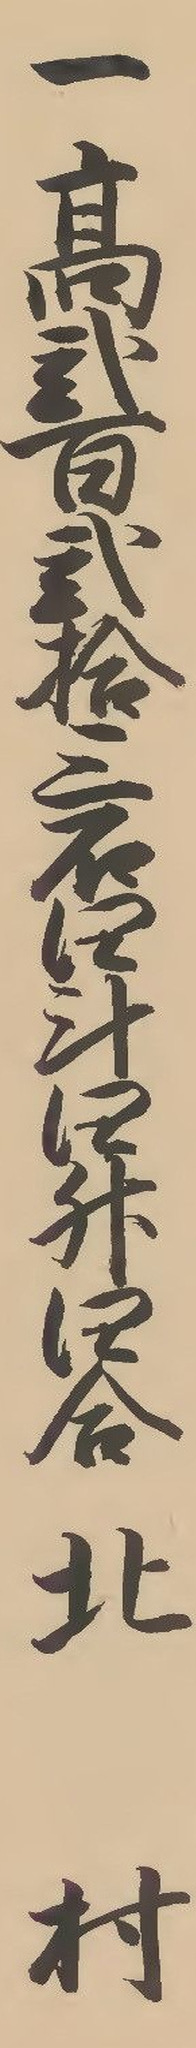一髙弐百弐拾三石四斗四升四合北村

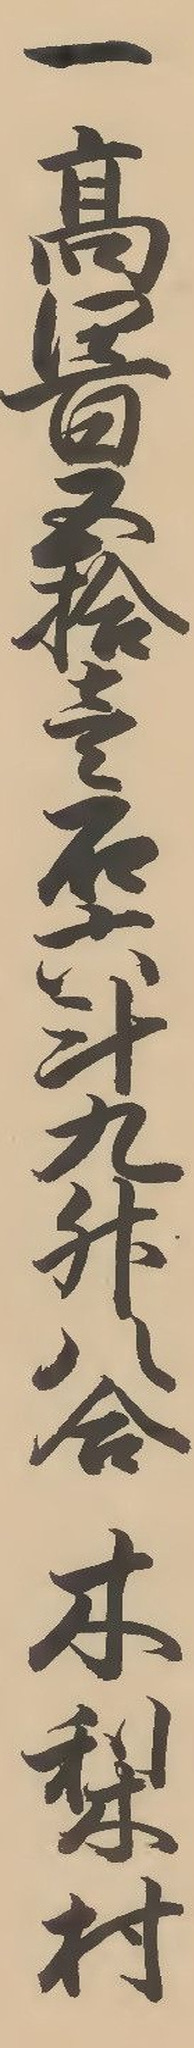一髙四百五拾壱石六斗九升八合木梨村
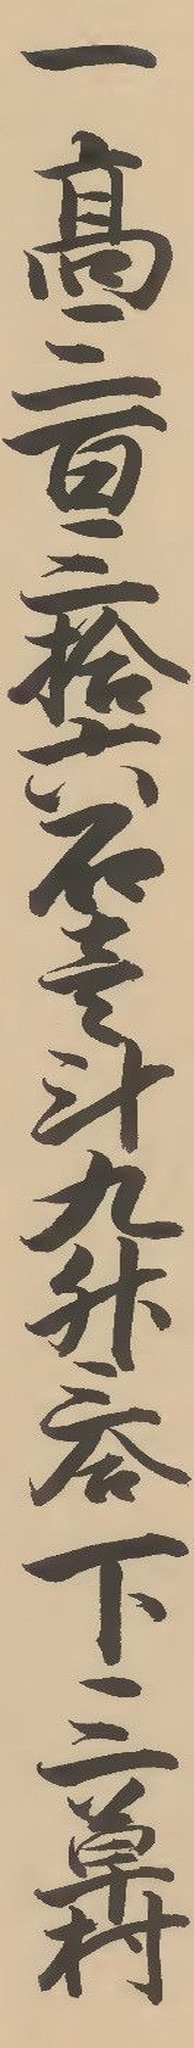一髙三百三拾六石壱斗九升三合下三草村
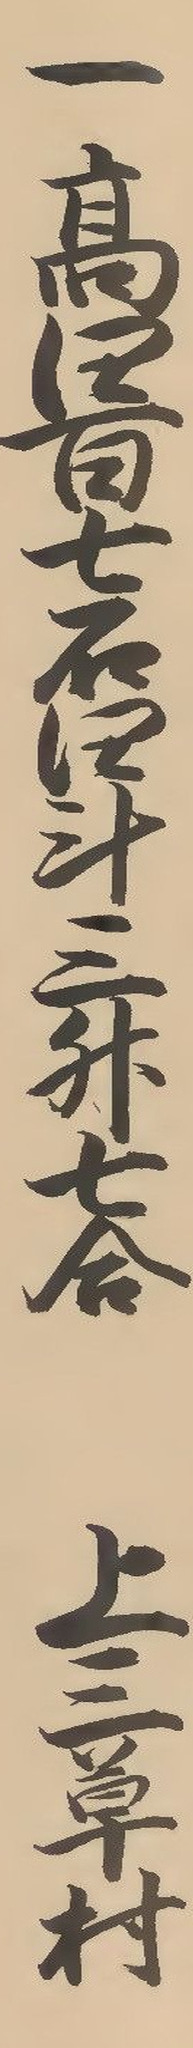一髙四百七石四斗三升七合上三草村
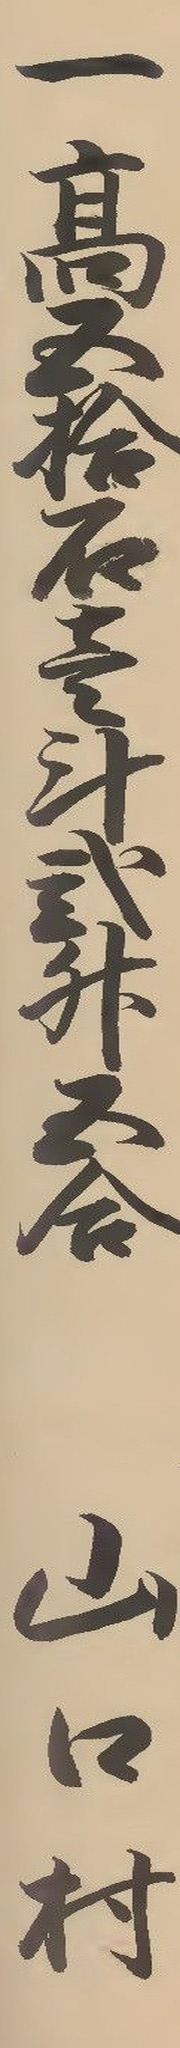一髙五拾石壱斗弐升五合山口村
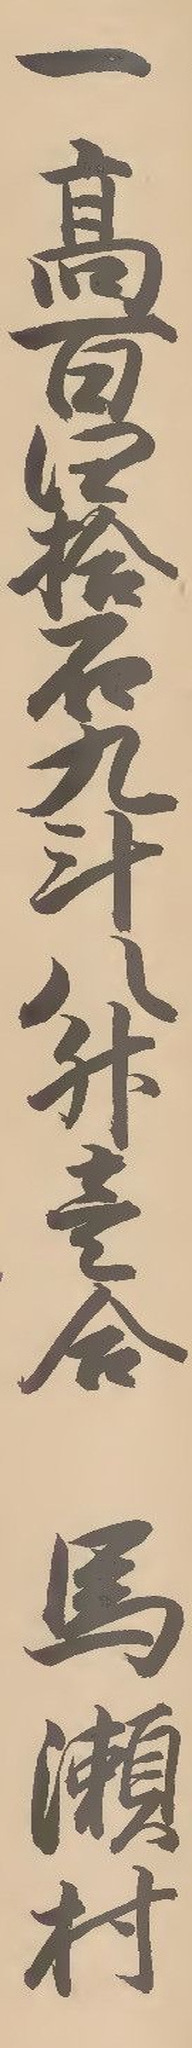一髙百四拾石九斗八升壱合馬瀬村
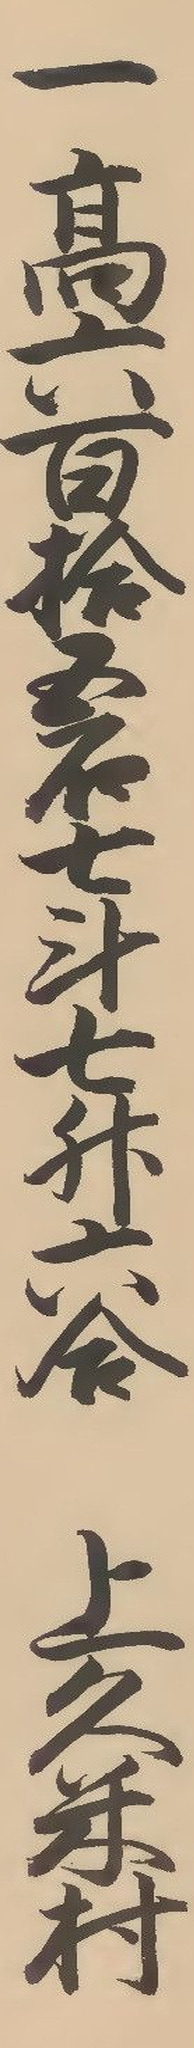一髙六百拾五石七斗七升六合上久米村
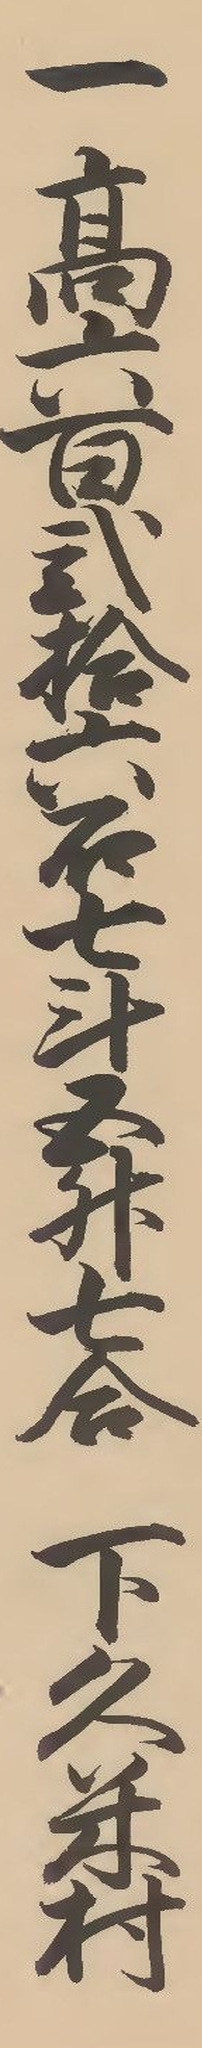一髙六百弐拾六石七斗五升七合下久米村
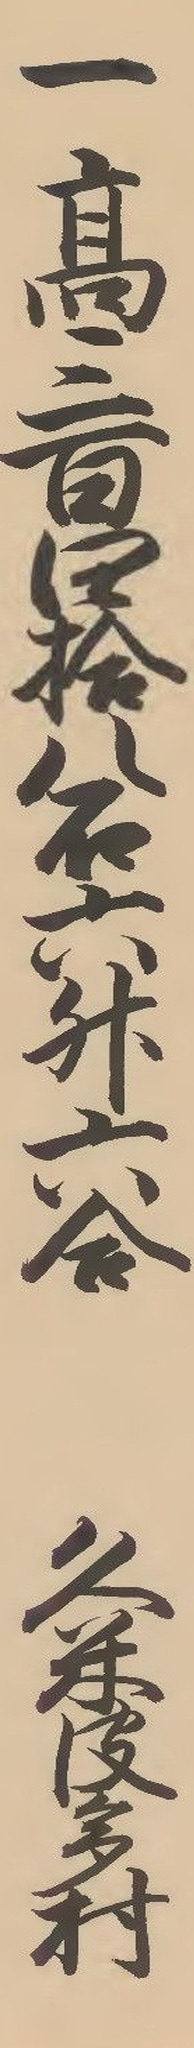一髙三百四拾八石六升六合久米皮多村

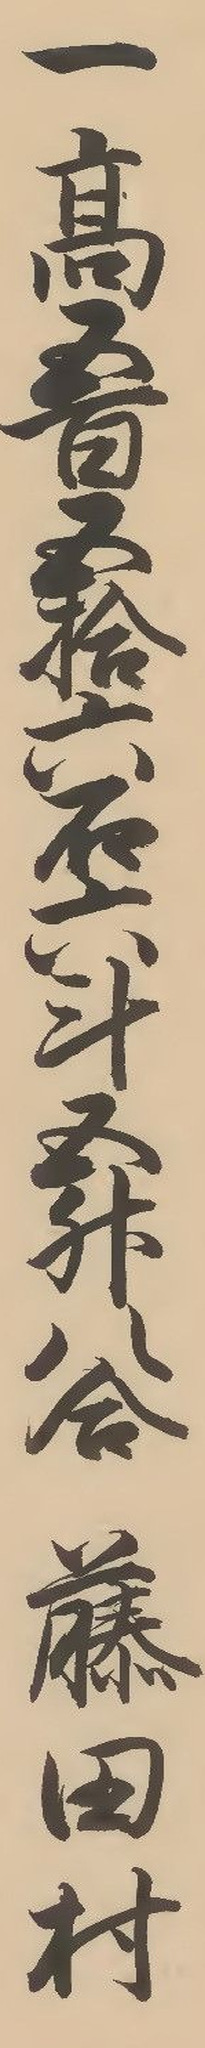一髙五百五拾六石六斗五升八合藤田村
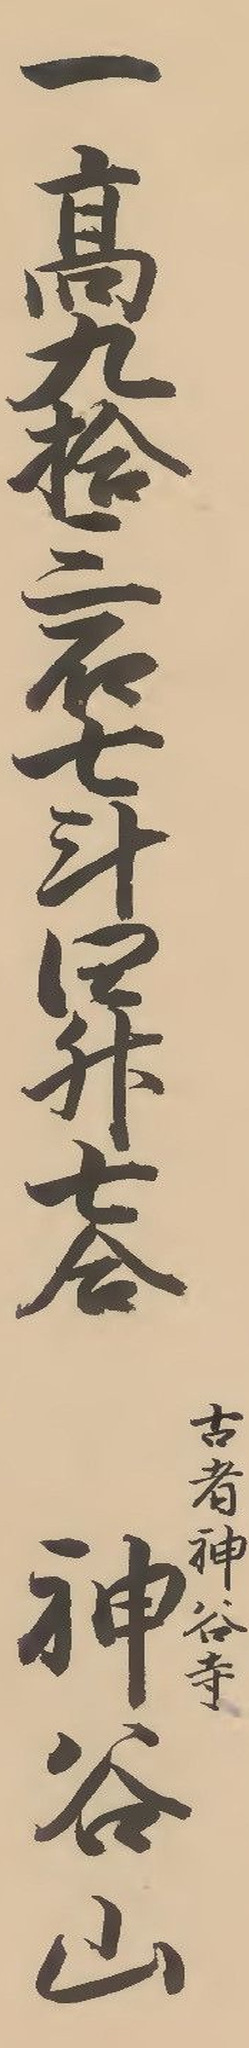一髙九拾三石七斗四升七合神谷山
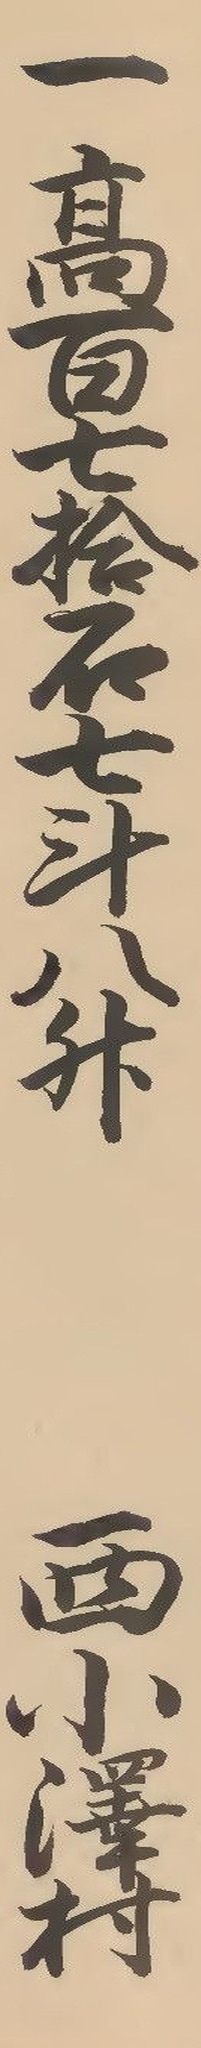一髙百七拾石七斗八升西小澤村
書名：播磨国郷帳
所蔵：国立公文書館 National Archives of Japan
